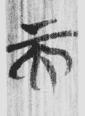而
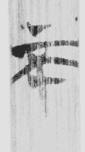不
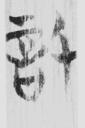信
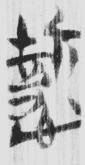{十言斤心}
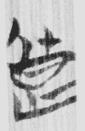良
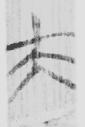夫
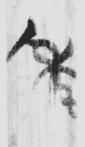年
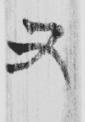又
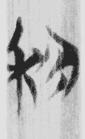利
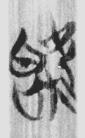{既火}
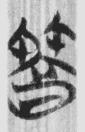{竹亯}
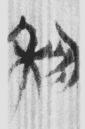利
